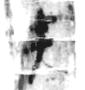內（入）
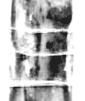吉
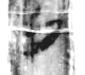㠯
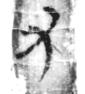又（有）
